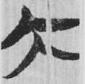大
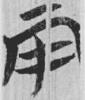雨
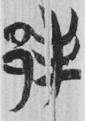邦
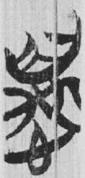○（賴）
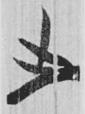之
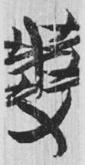○（發）
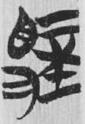○（馹）
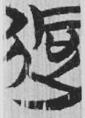○（蹠）
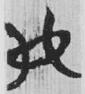四四
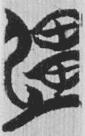疆疆
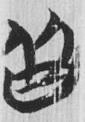皆
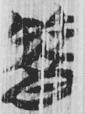○（熟）
